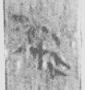九十=
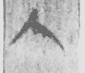六
